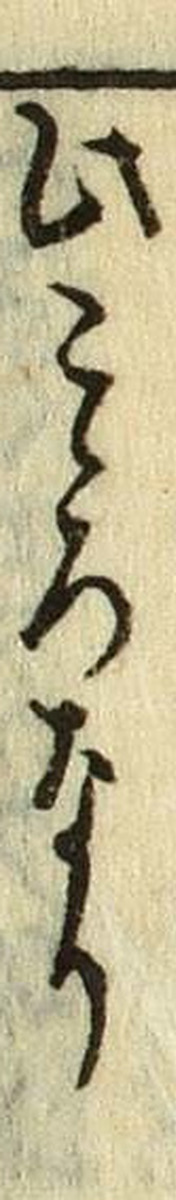此こゝろなり
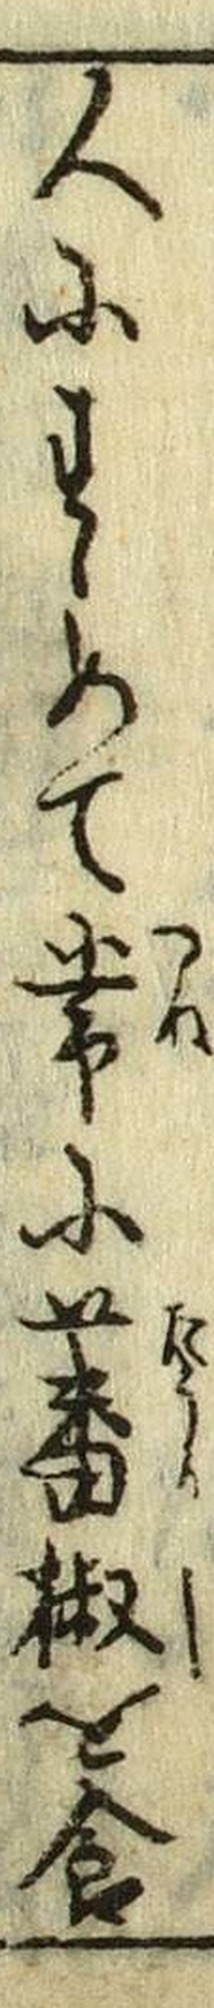人にすゝめて常に蕃椒を食
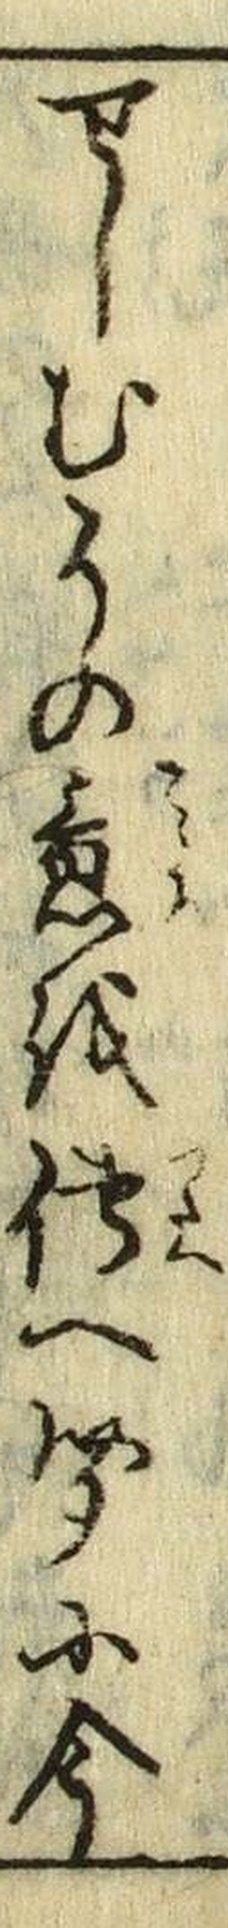せしむその意を伝へ聞に今

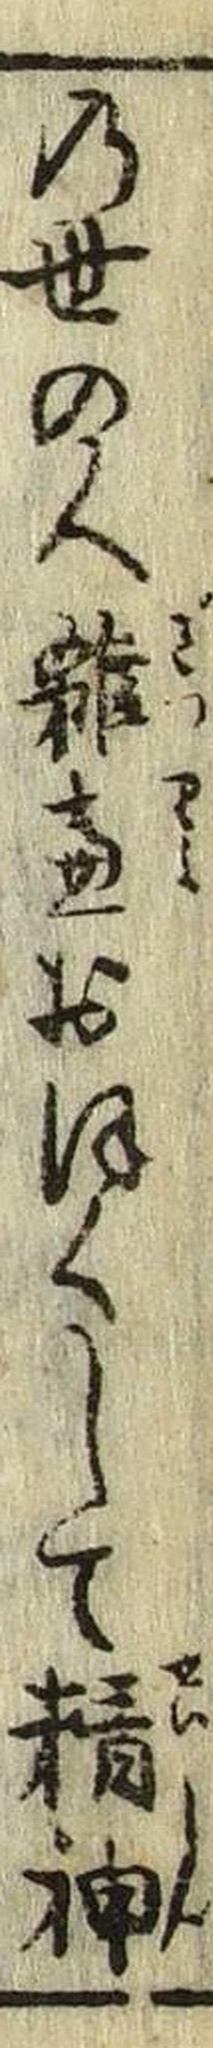の世の人雑慮おほくして精神
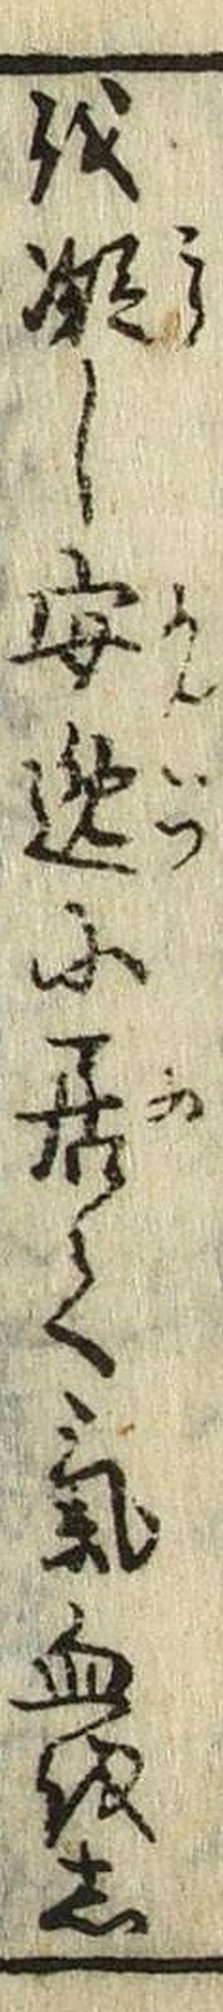を凝し安逸に居て気血をし
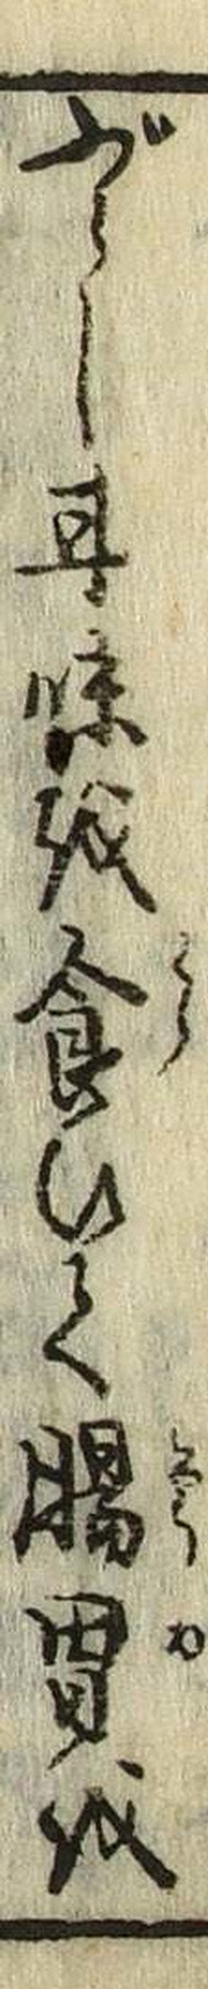ぶらし甘味を食ひて腸胃を
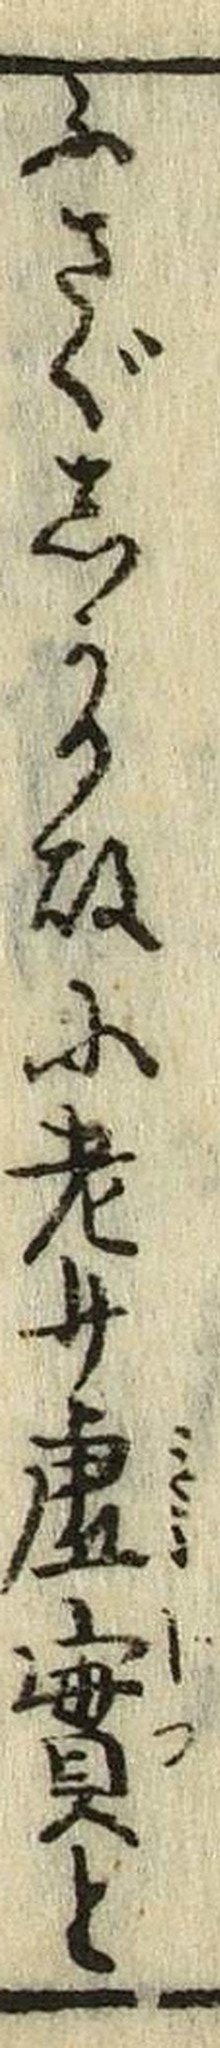ふさぐしかる故に老少虚実と
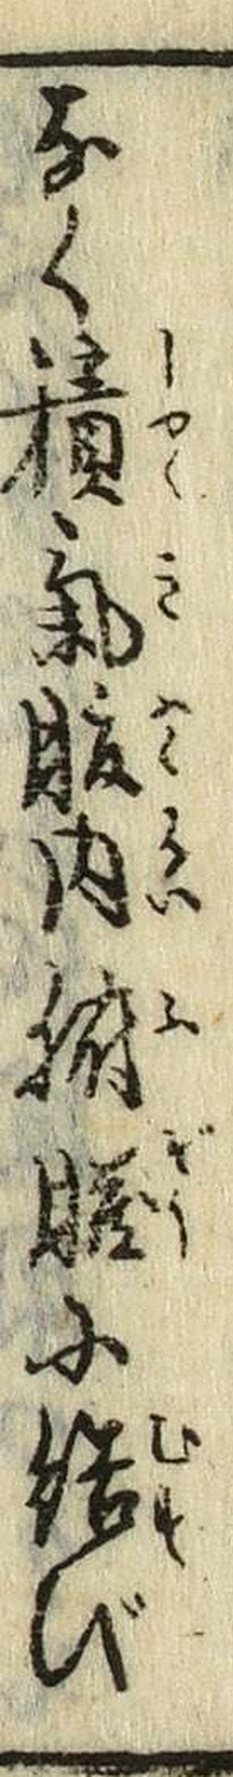なく積気腹内腑臓に結び
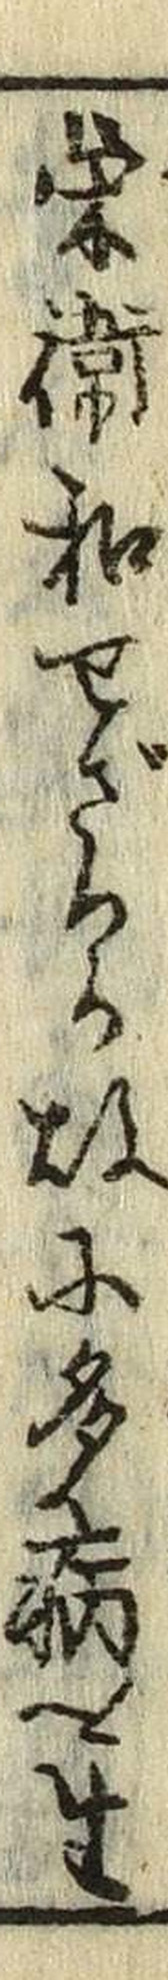栄衛和せざるか故に多病を生
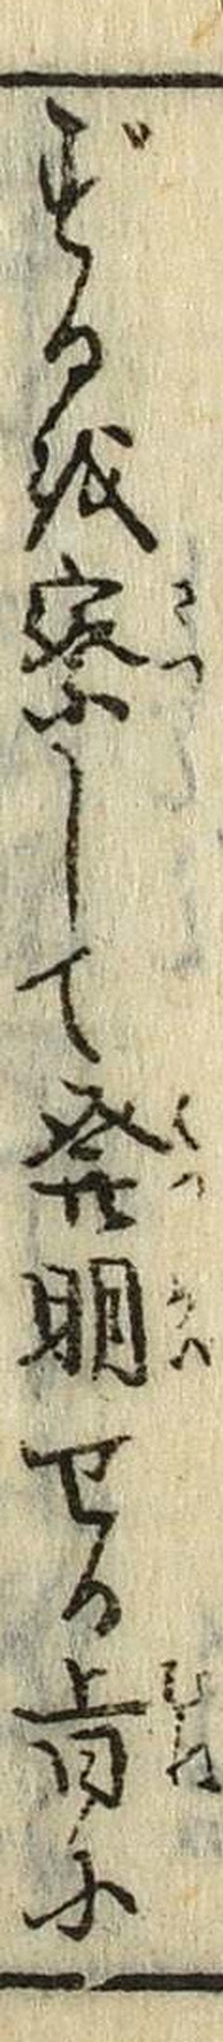ずるを察して発明せる旨に
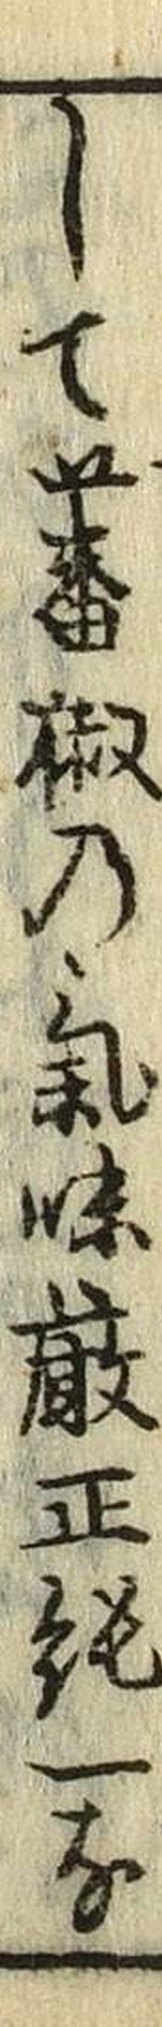して蕃椒の気味厳正純一な
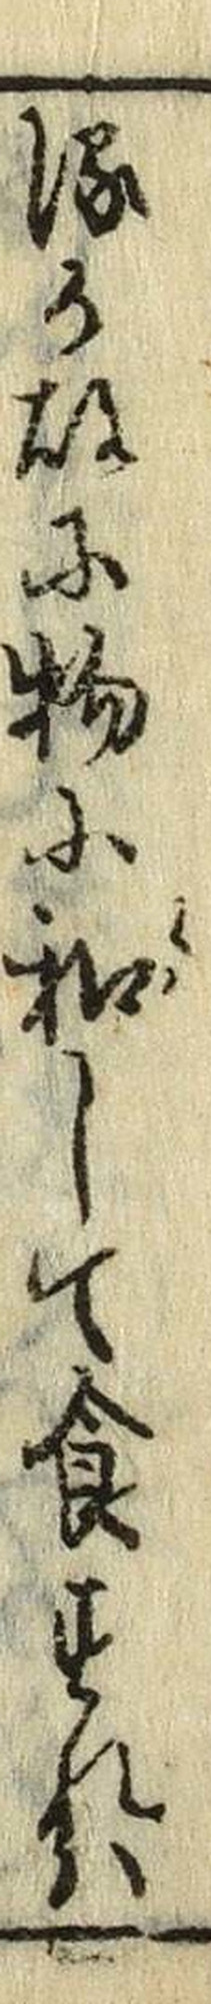るか故に物に和して食すれは
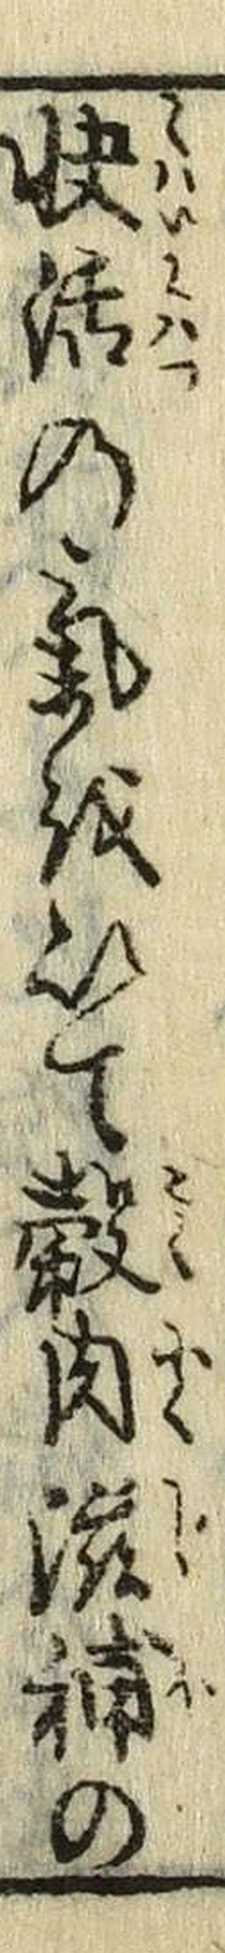快活の気を以て穀肉滋補の
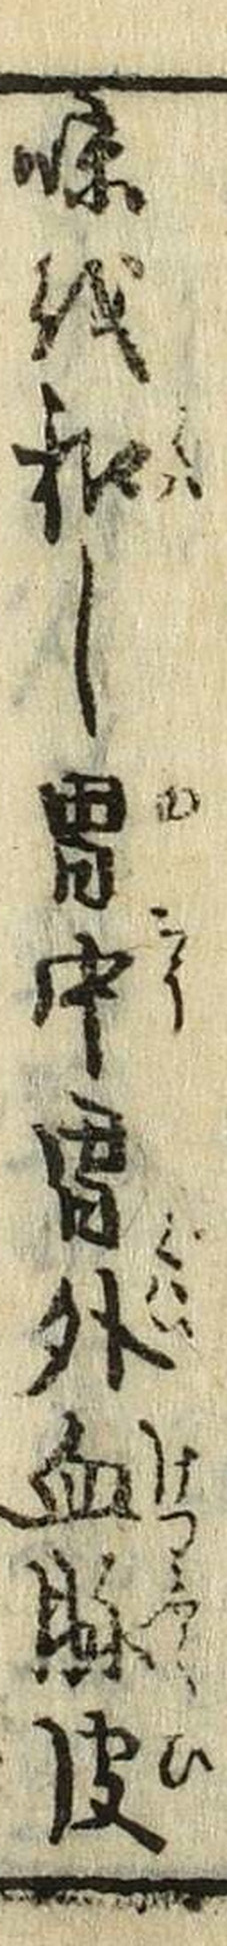味を和し胃中胃外血脈皮
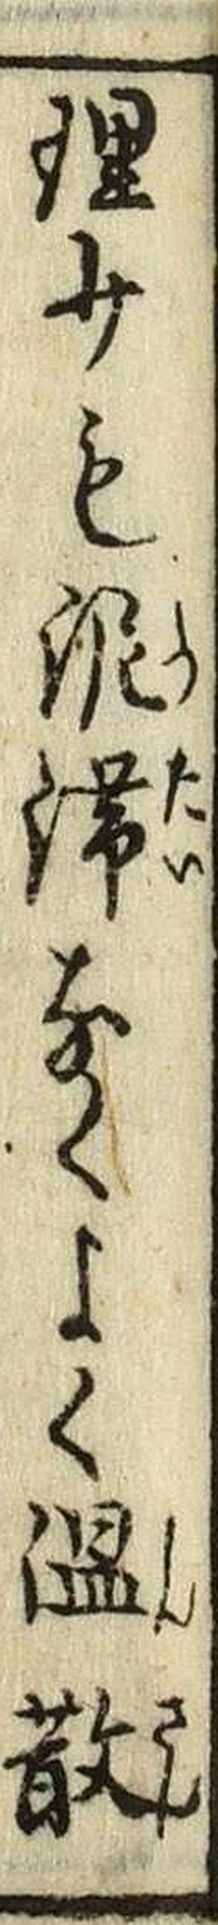理少も泥滞なくよく温散
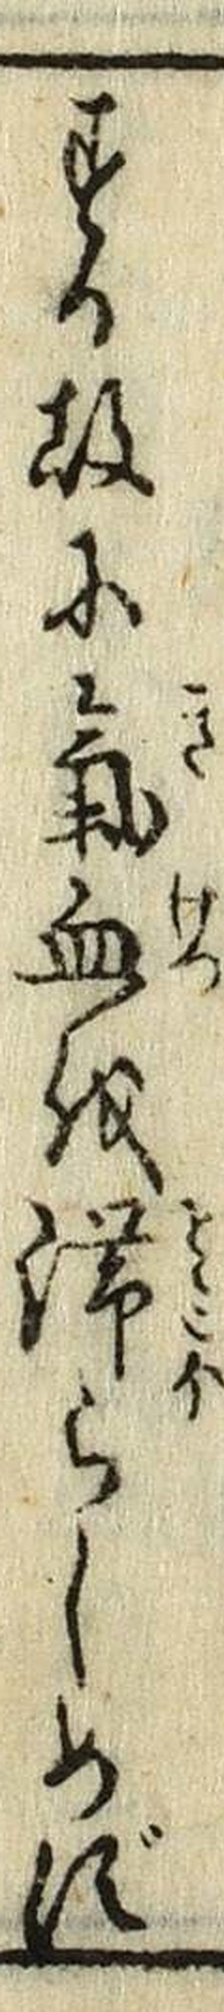する故に気血を滞らしめず
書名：居家養生記
